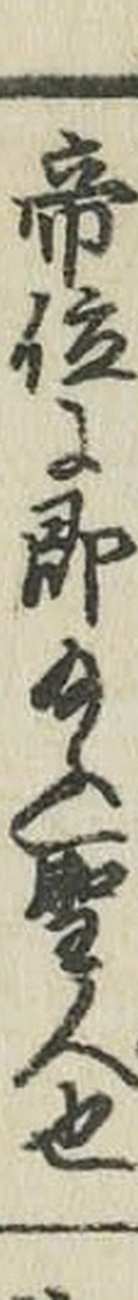帝位に即給ふ聖人也
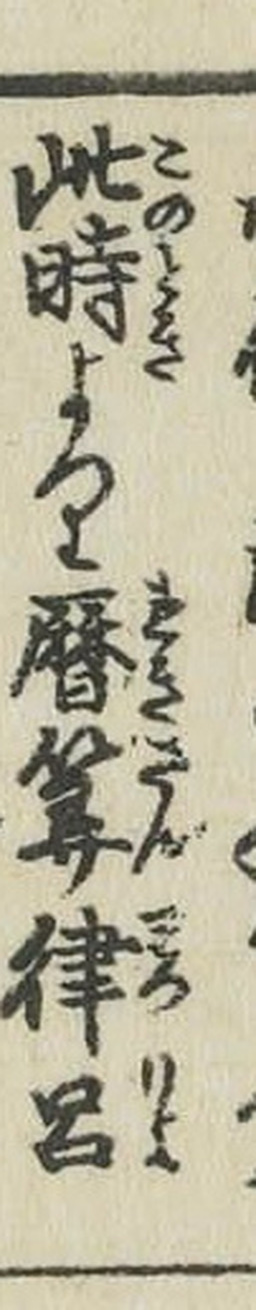此時より暦算律呂
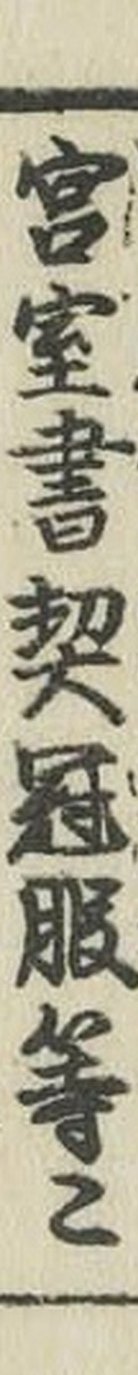宮室書契冠服等こ
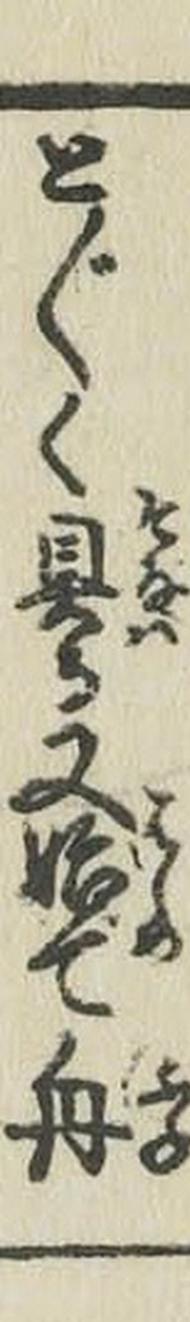と〴〵く具る又始て舟
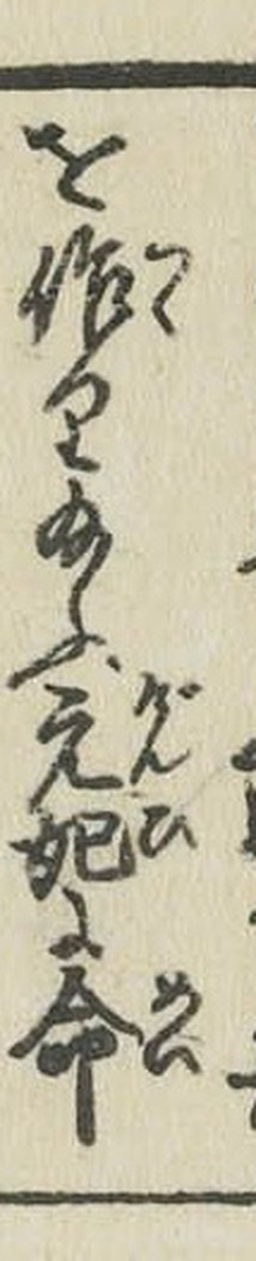を作り給ふ元妃に命
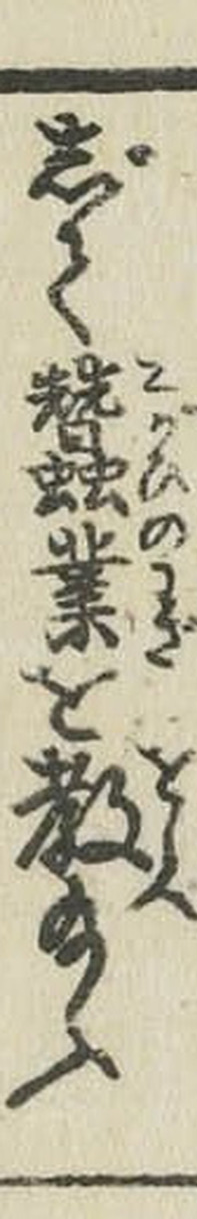じて蚕業を教給ふ
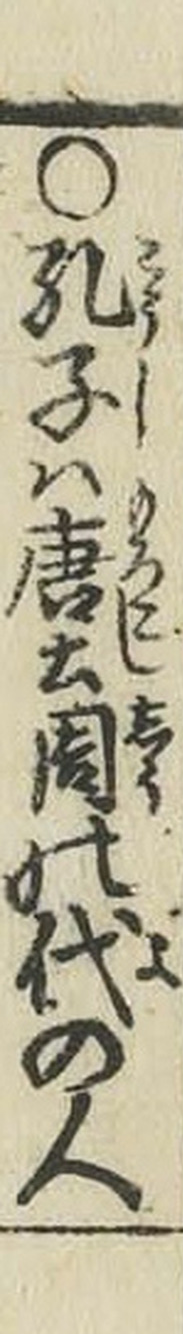○孔子は唐土周の代の人
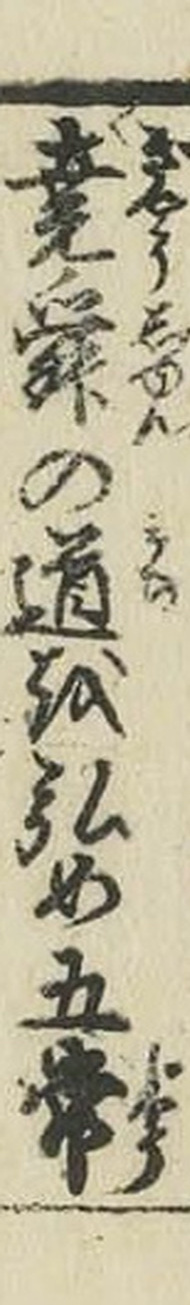尭舜の道を弘め五常
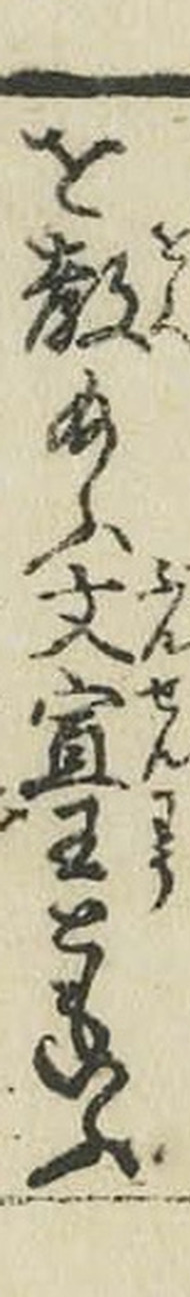を教給ふ文宣王ともいふ
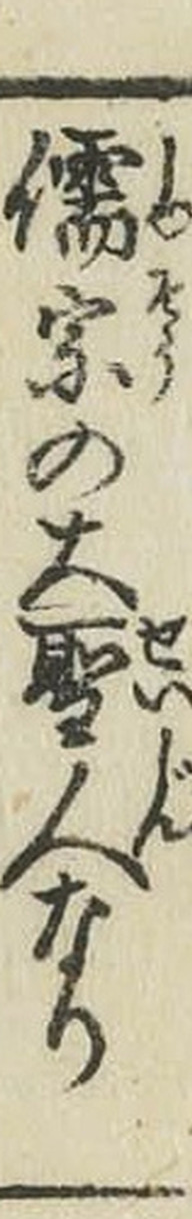儒宗の大聖人なり
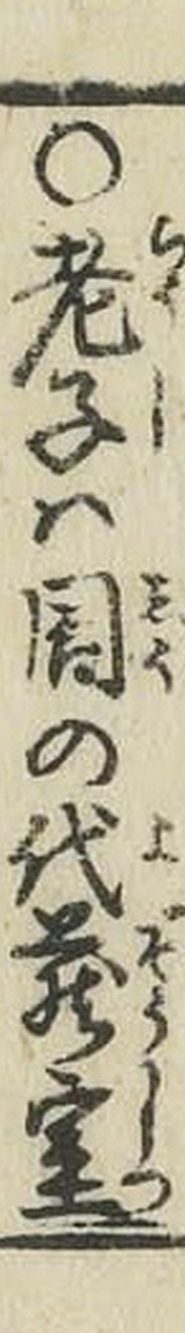○老子は周の代蔵室
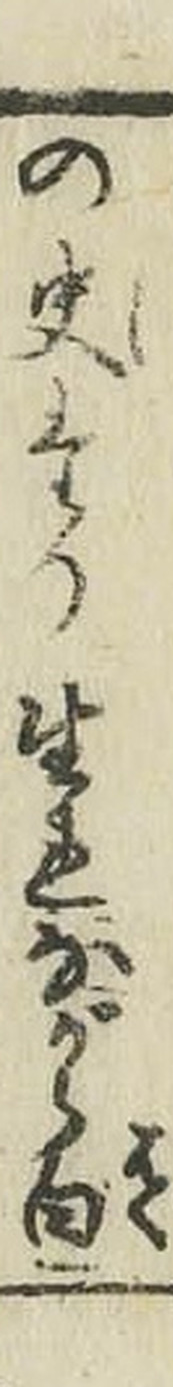の史たり生れながら白
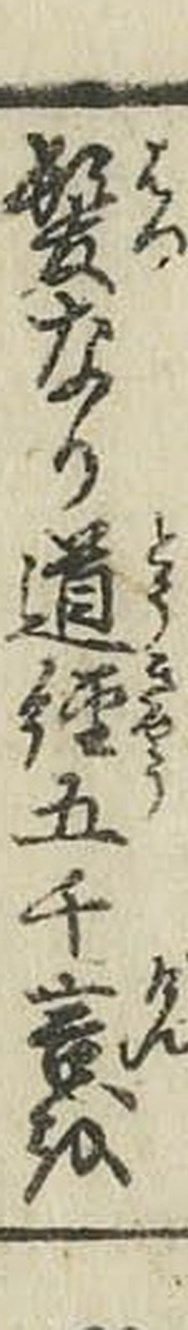髪なり道経五千言を
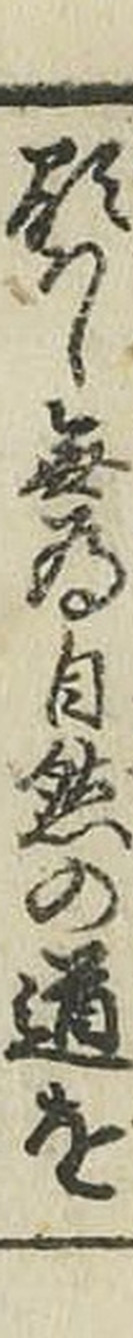顕はし無為自然の道を
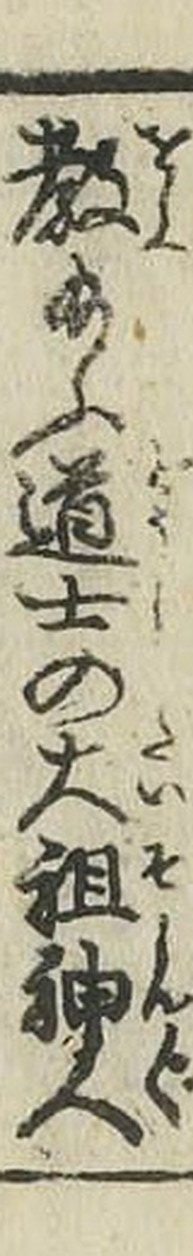教給ふ道士の大祖神人
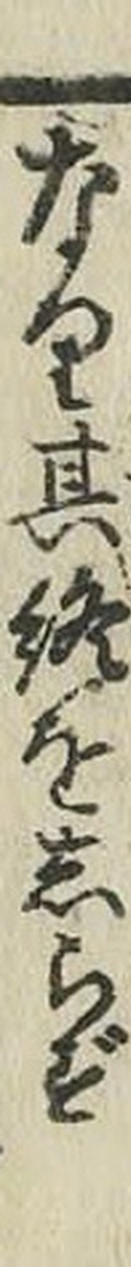なり其終をしらず
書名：増補頭書訓蒙図彙大成 10巻 10:巻之21
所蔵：東京学芸大学教育コンテンツアーカイブ
